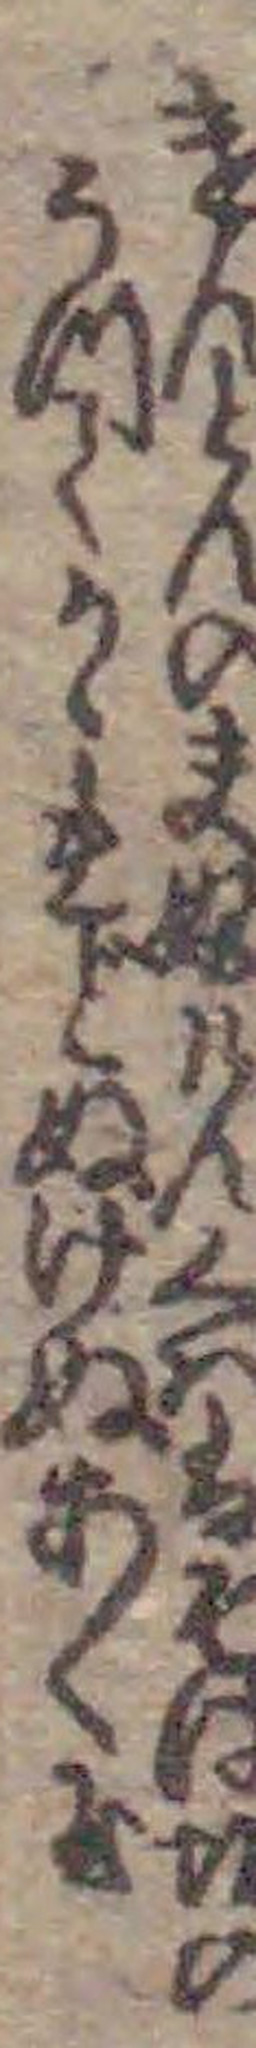うつてかゝれどうけぬあく玉

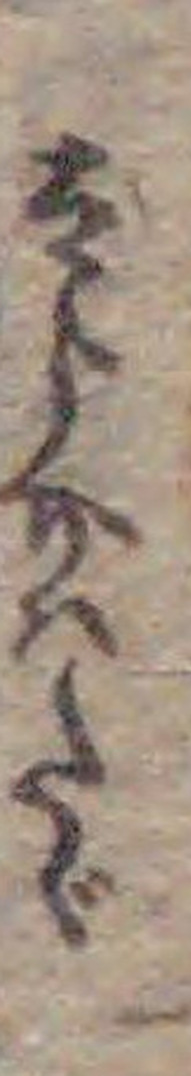太郎介はたゞ
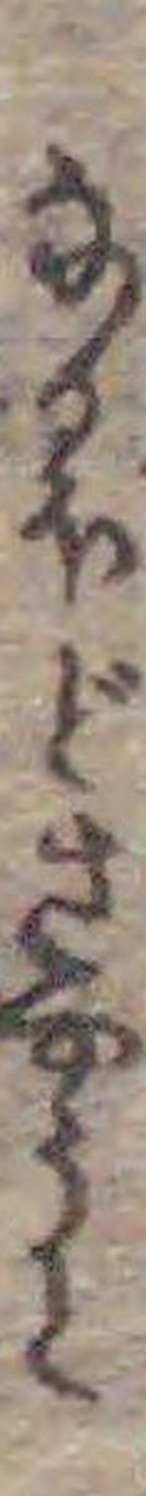なるほどさやうと
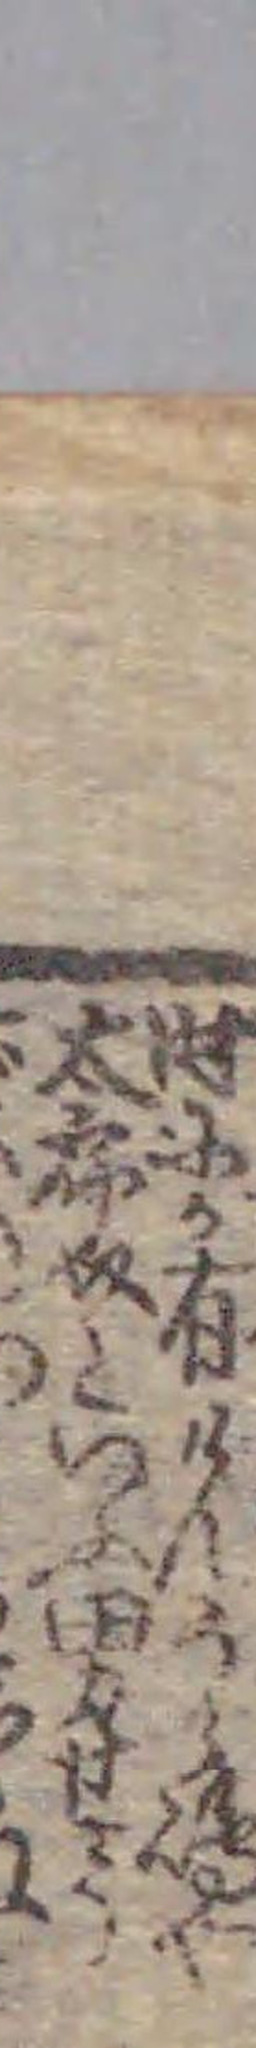太郎介といふ男せう
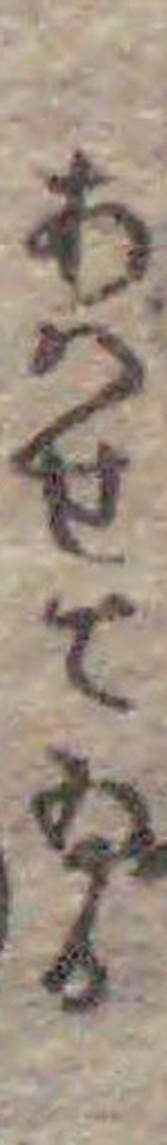あはせてゐる
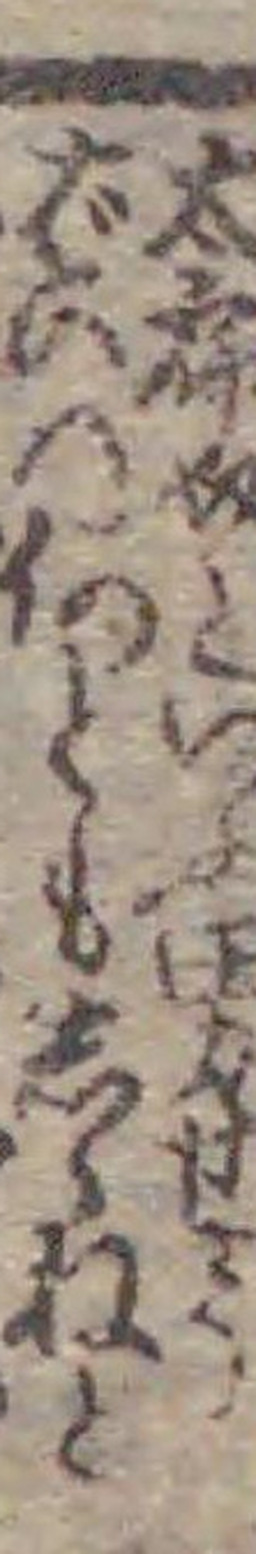ばいは何ともしらねと
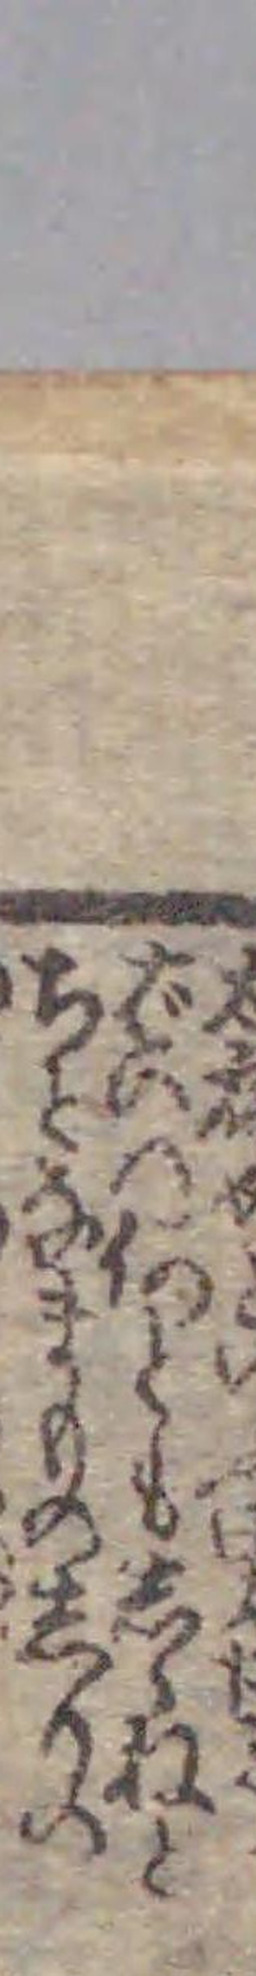ちとなまものしりの
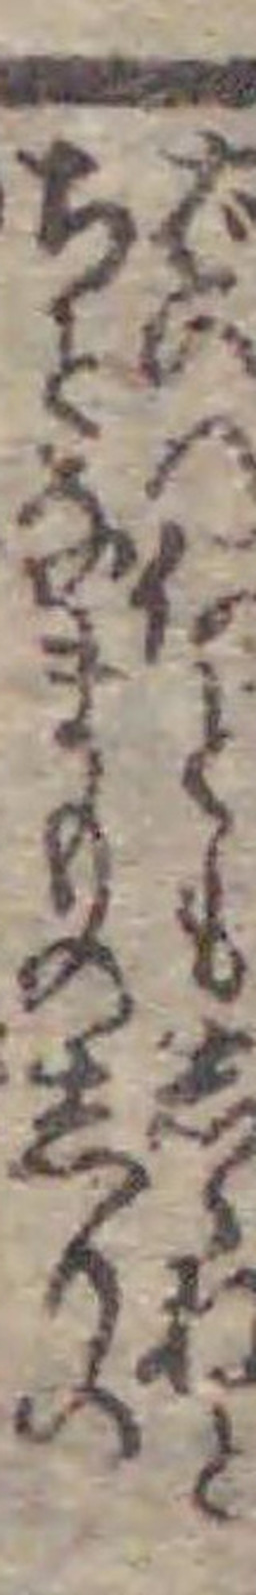ちとなまものしりの
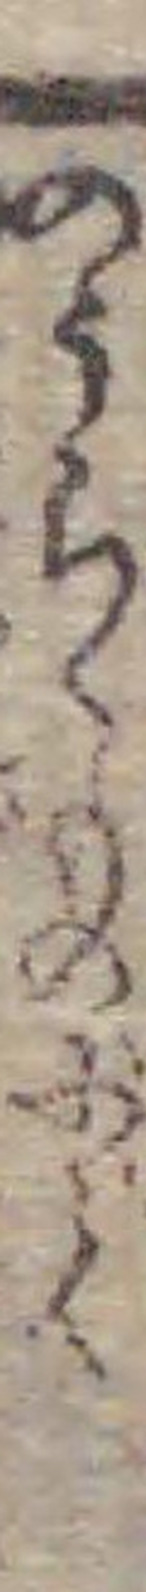のうらくものにて
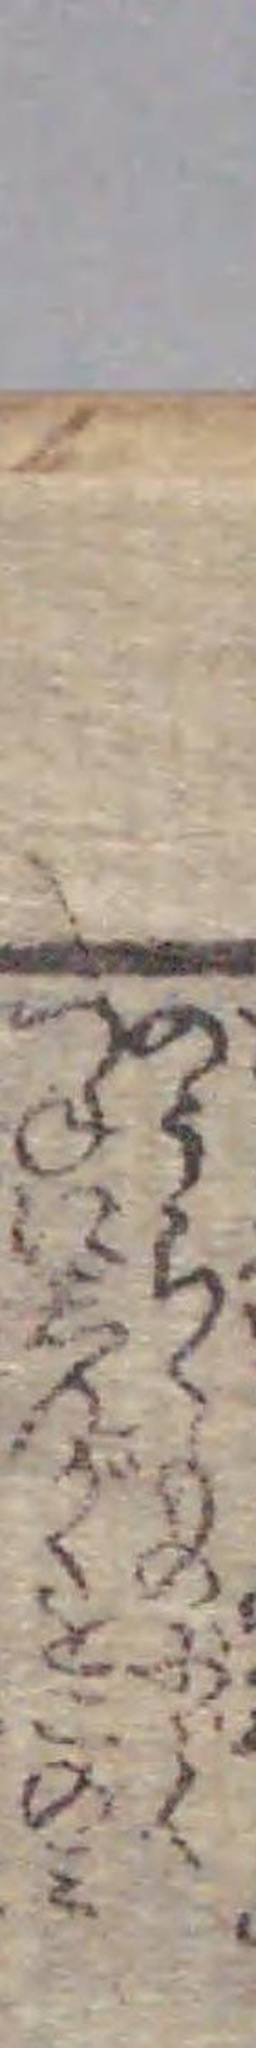つねにしんがくをこのみ
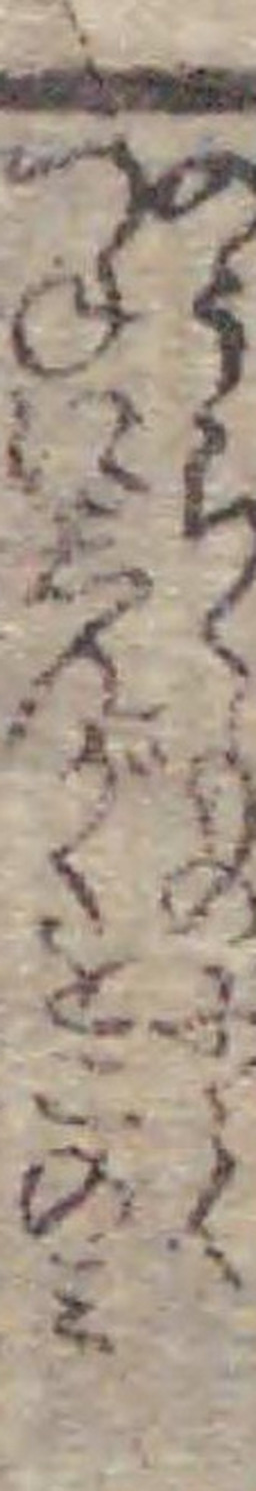つねにしんがくをこのみ
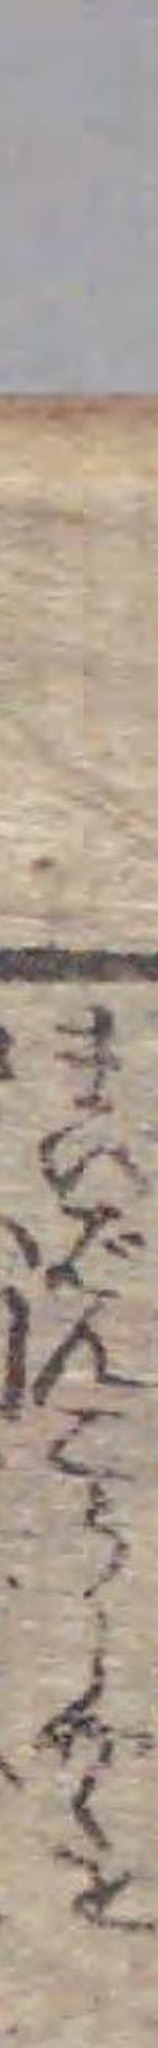まいばんこうしやくを
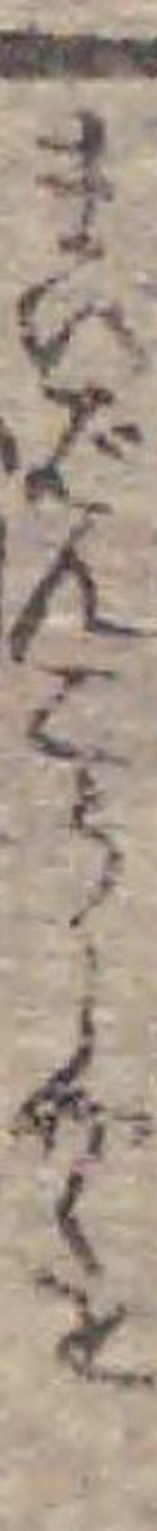まいばんこうしやくを
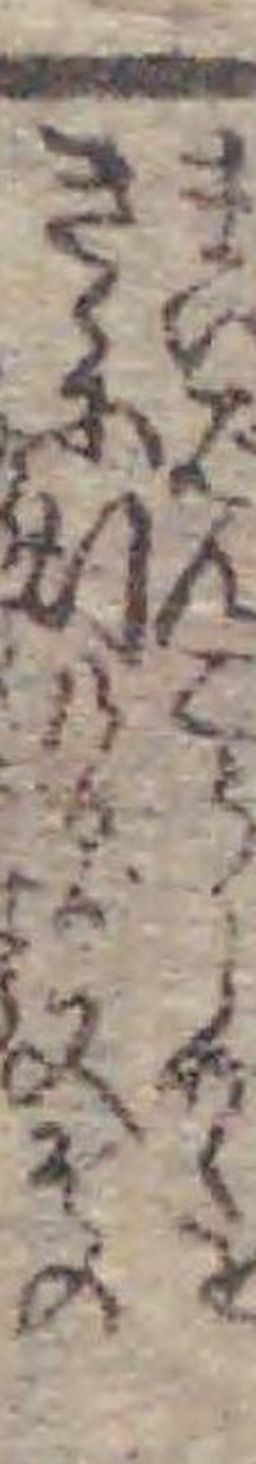きゝに行けるが又その
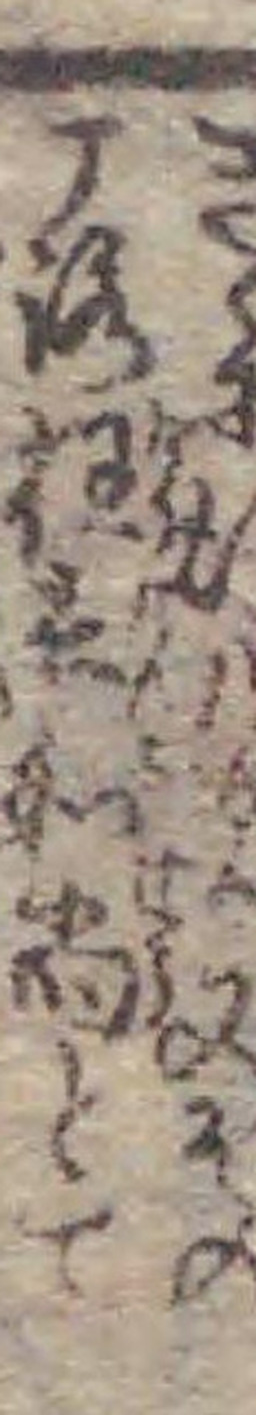ころ狂言和尚とて
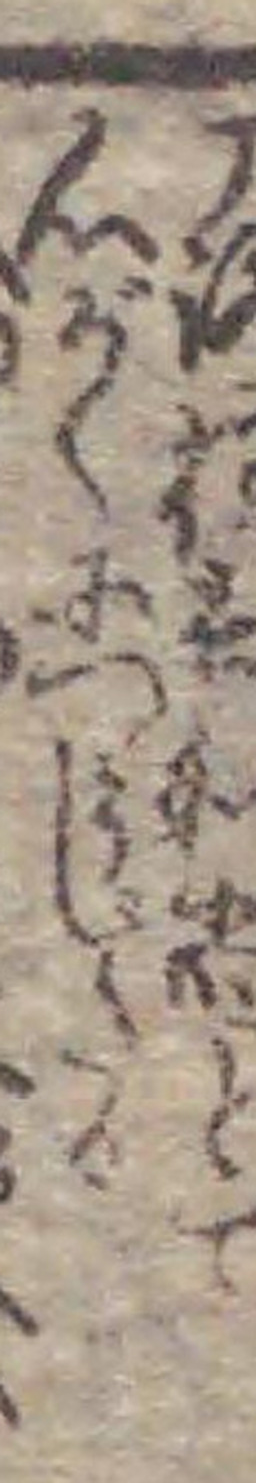心がくにつうじたる
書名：四遍搨心学草帋 : 3巻
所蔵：国立国会図書館 National Diet Library, JAPAN
